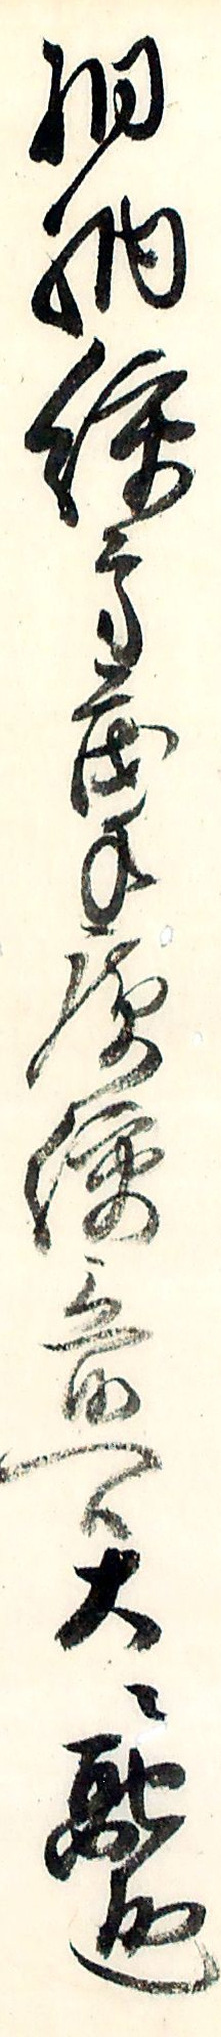相納絞方も手広絞立候へは大に融通
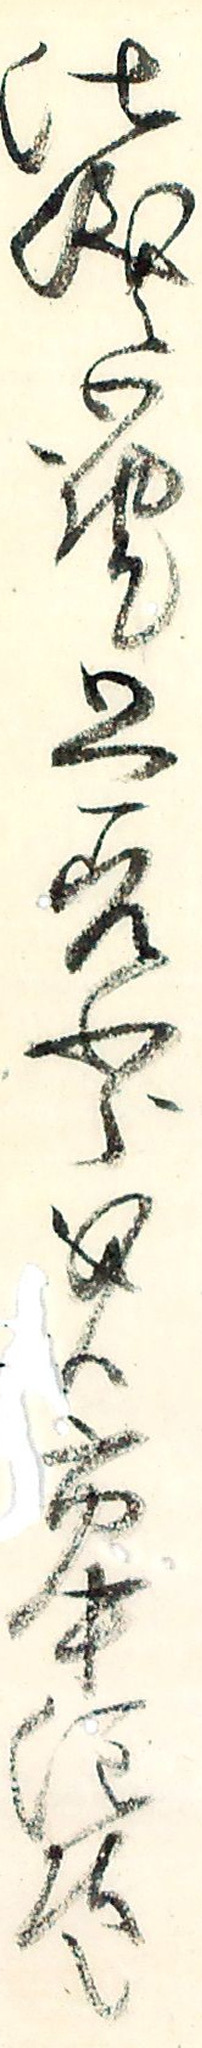仕儀に御座候且善五郎義は市中住居之
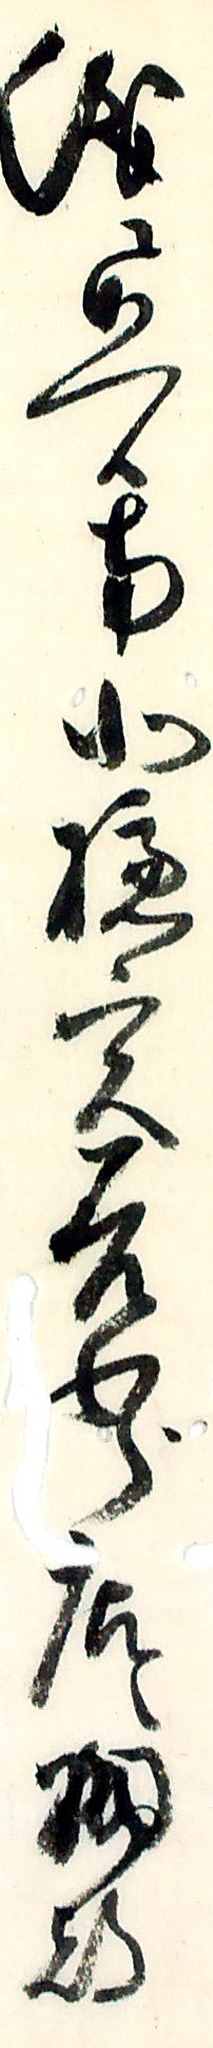儀に候へは南北櫨実善五郎店へ相都
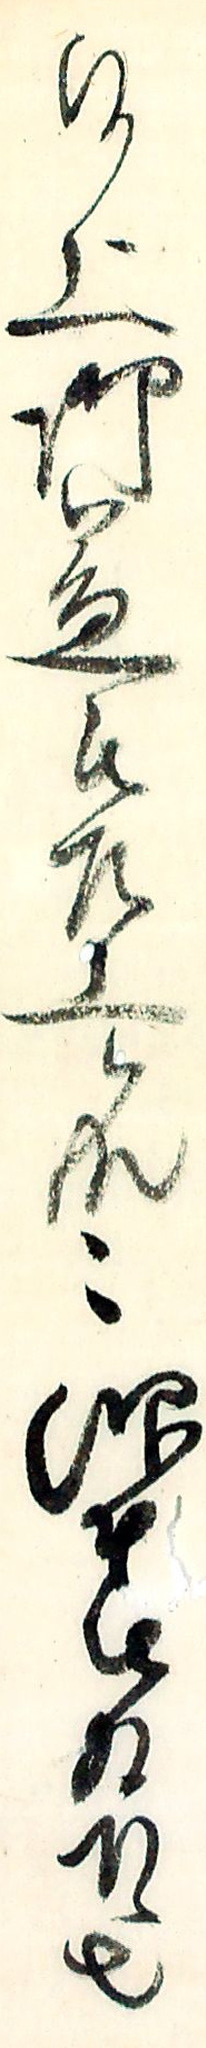候上御益被召上候様被仰付被為下候は
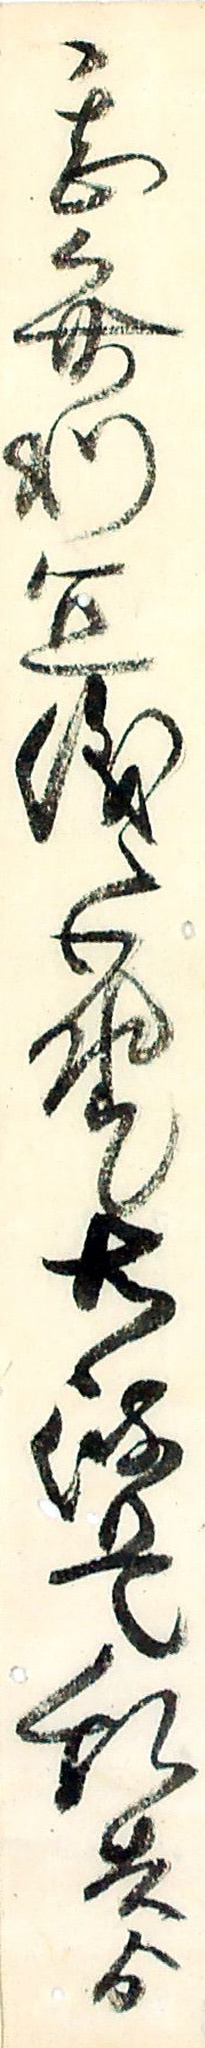甚弁利宜儀に御坐候右彼是私共ゟ
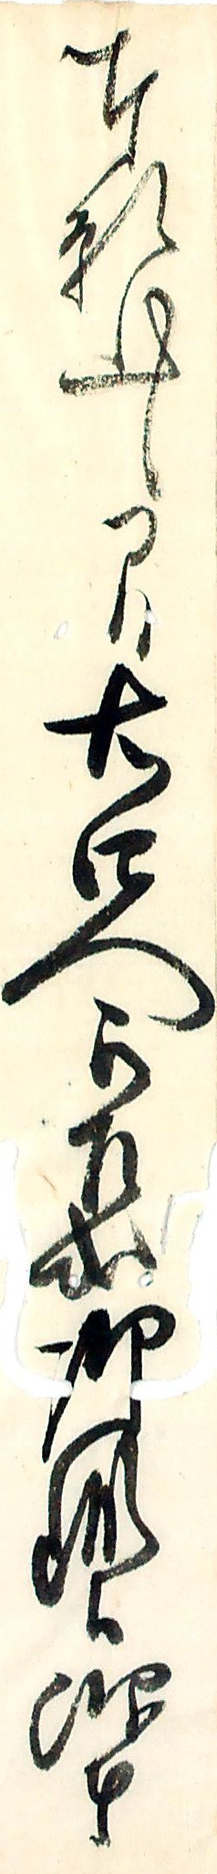奉願上候間右四人被召出御鍛被仰付
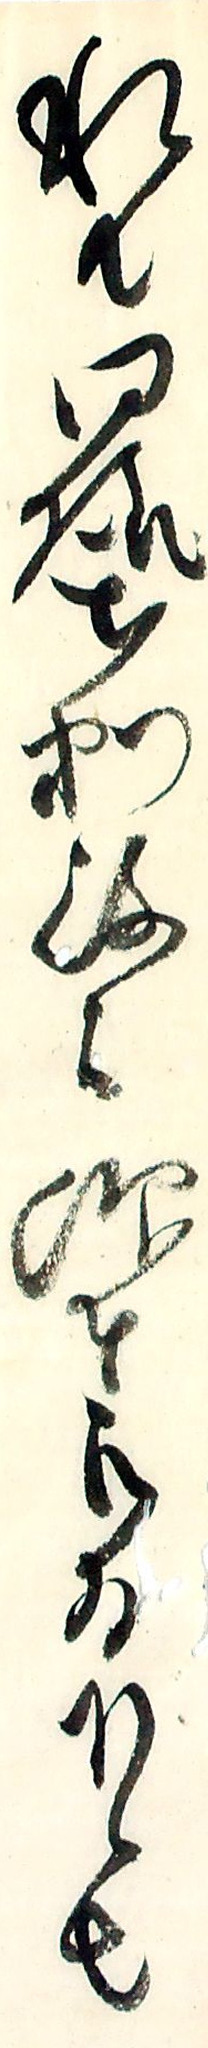私共同様才判役被仰付被為下候は
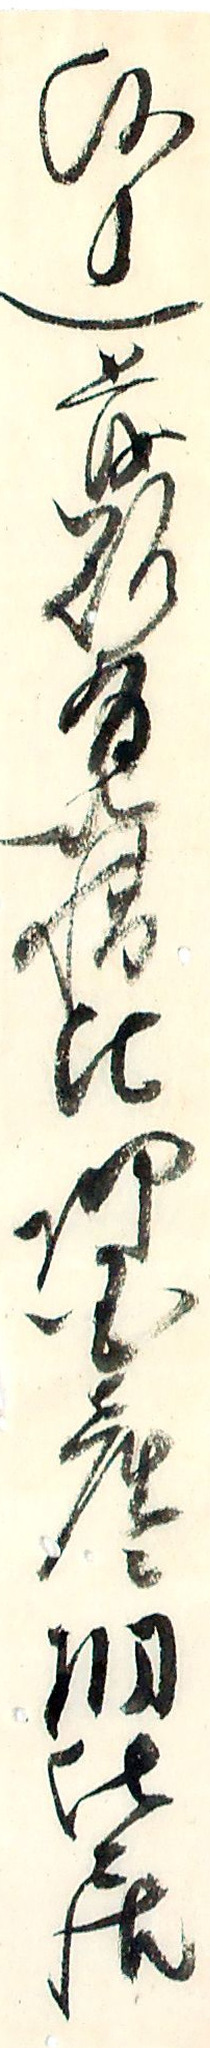何れも難有出精仕御国産に相仕居
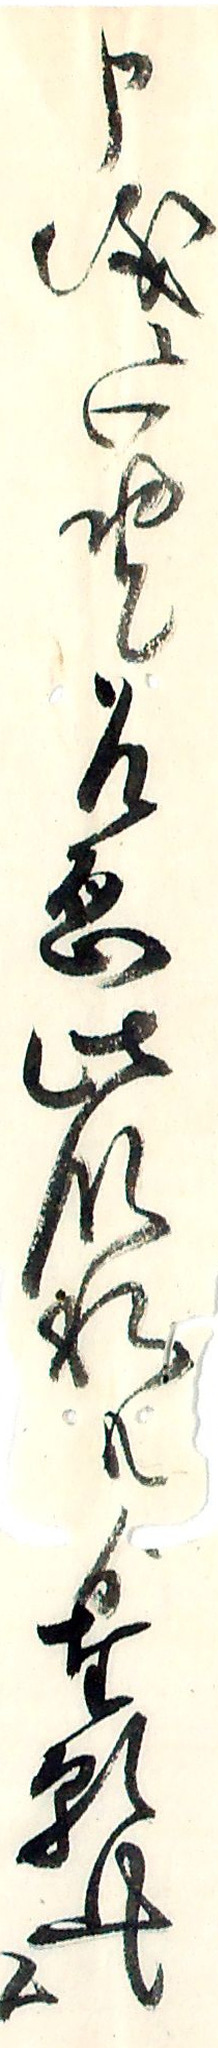申儀に御坐候乍恐此段私共ゟ願上候以上

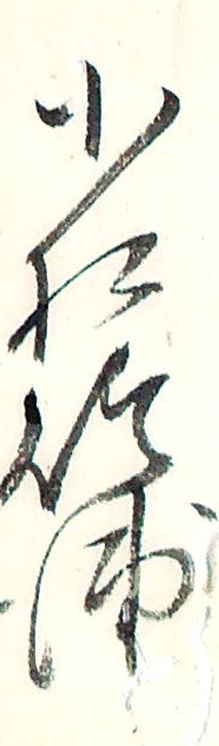小松島浦
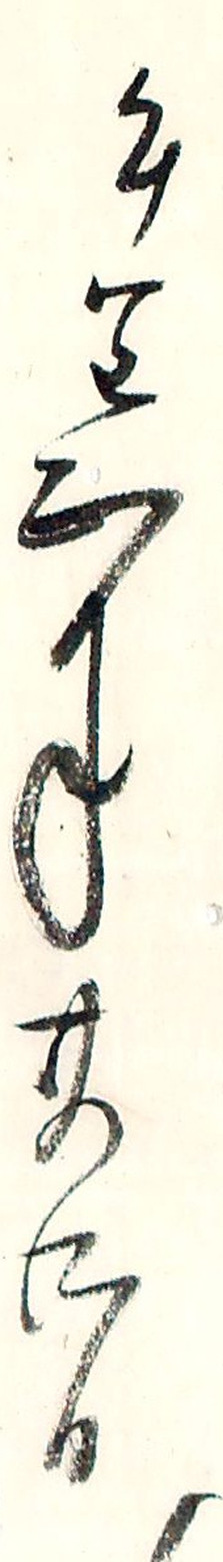午閏正月廿四日
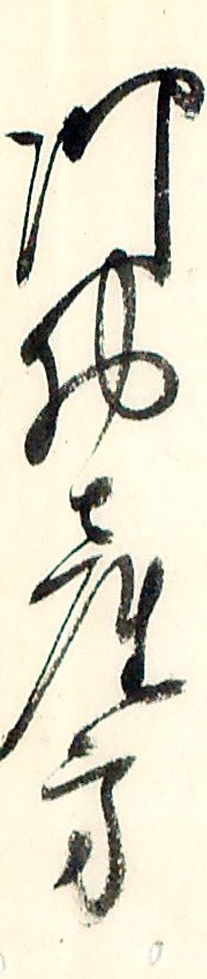御物産方
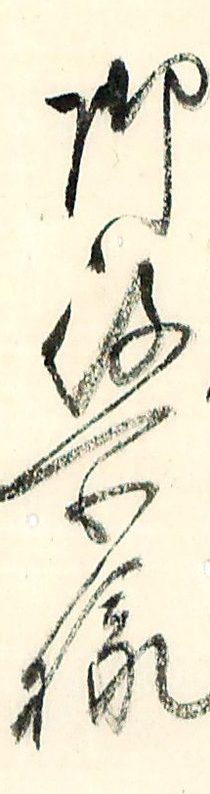御役所様
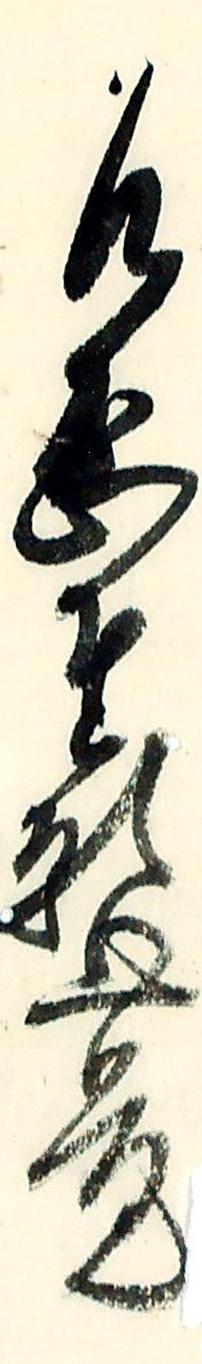乍恐奉願上覚
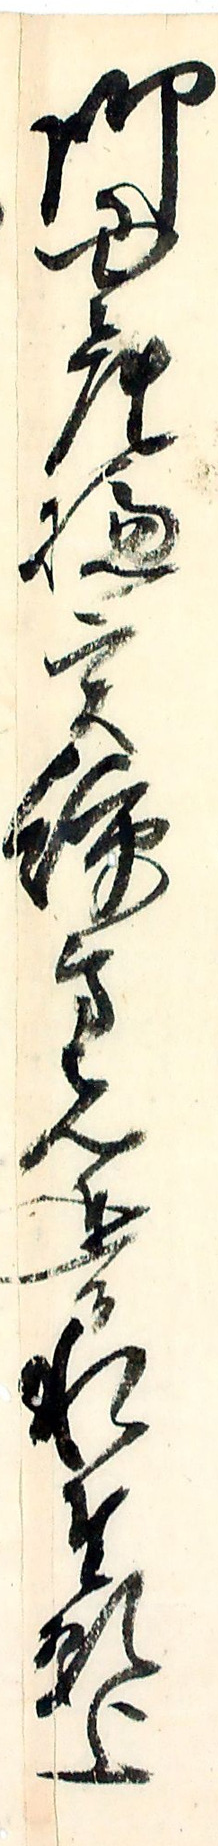御国産櫨実絞方先達而私奉願上
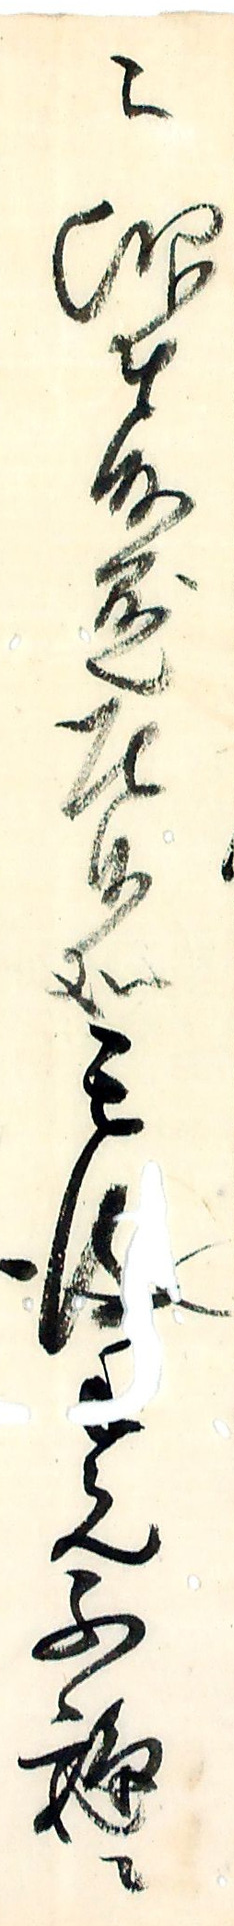被仰付取懸居候処其後手元不穏に
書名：乍恐奉願上覚（御国産櫨植付並実取集売捌等)他
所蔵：鳴門教育大学 Naruto University of Education
